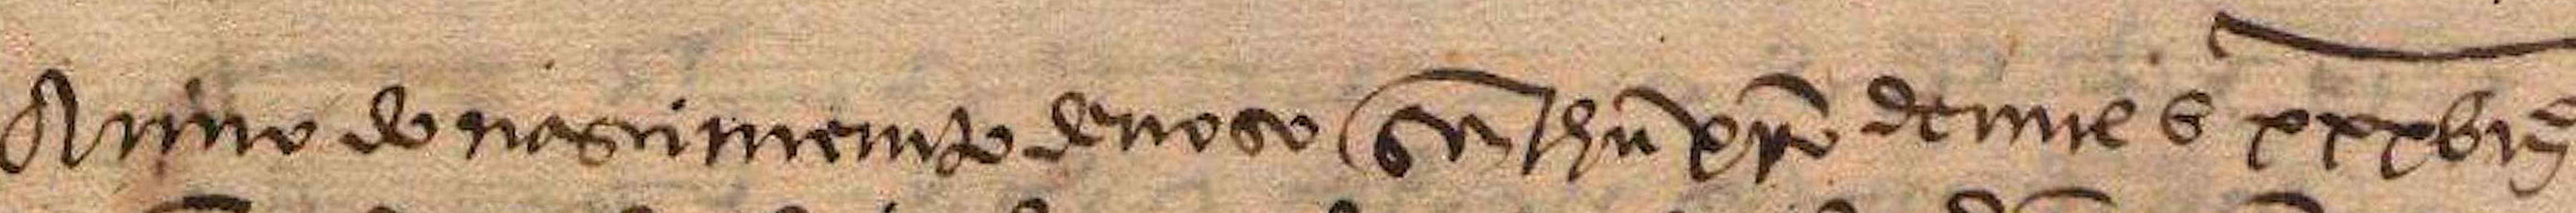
Anno do nascimemto de noso s̄or Jhū xp̄o de mil bcxxxbiijo
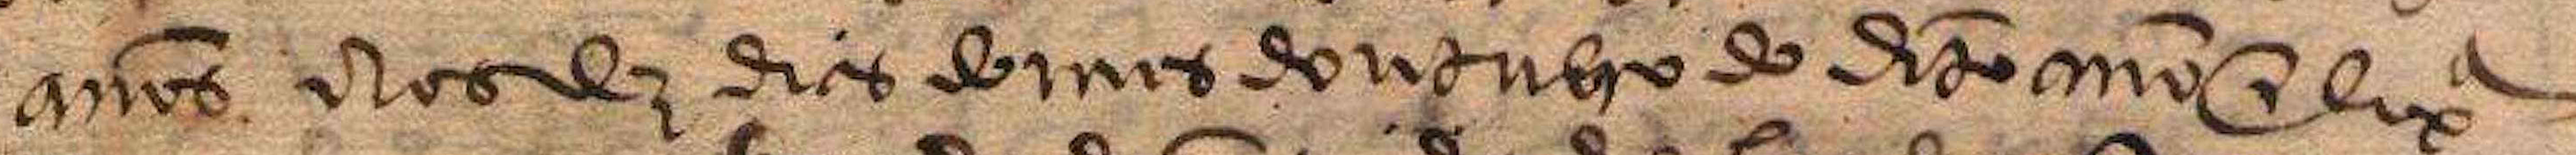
anōs Aos dez dias do mes doutubro do dito anō ē lixa
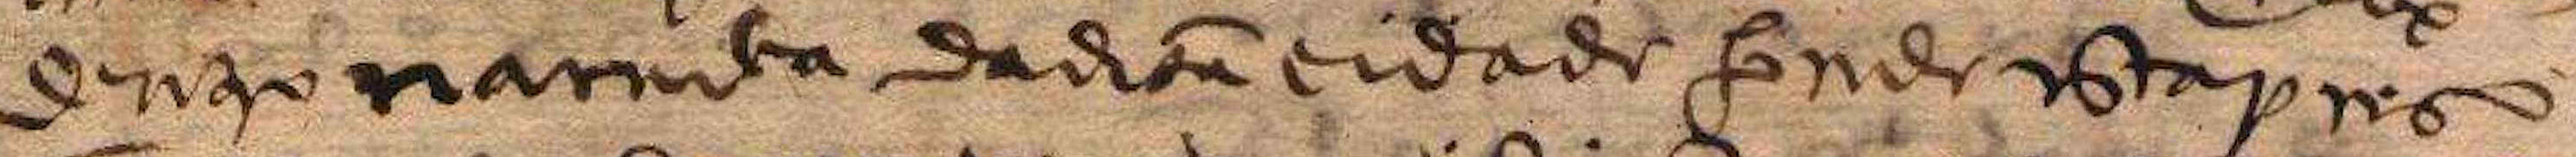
dentro na cadea da dita cidade honde esta preso
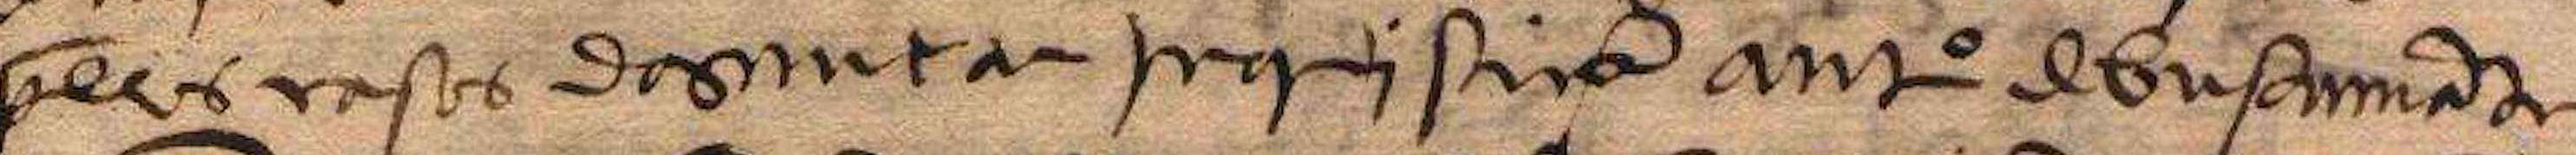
p̄llos casos da sancta Jnqujsiçā anto de bustamāte
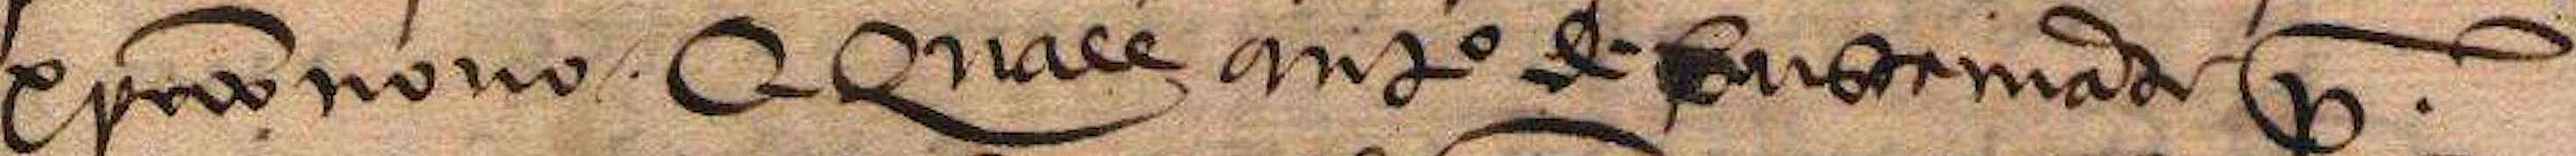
xpaõ nouo /. O Quall anto de bustamāte p̄o.
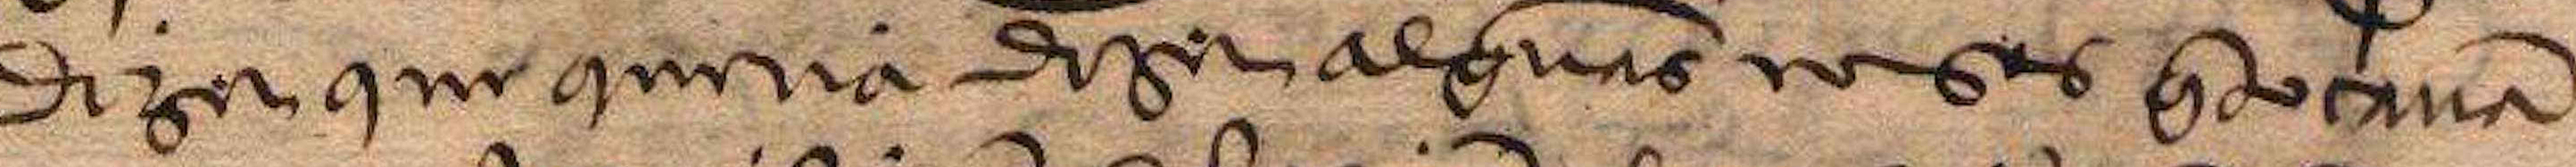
dizer que queria dizer algūas cousas q̄ tocauā
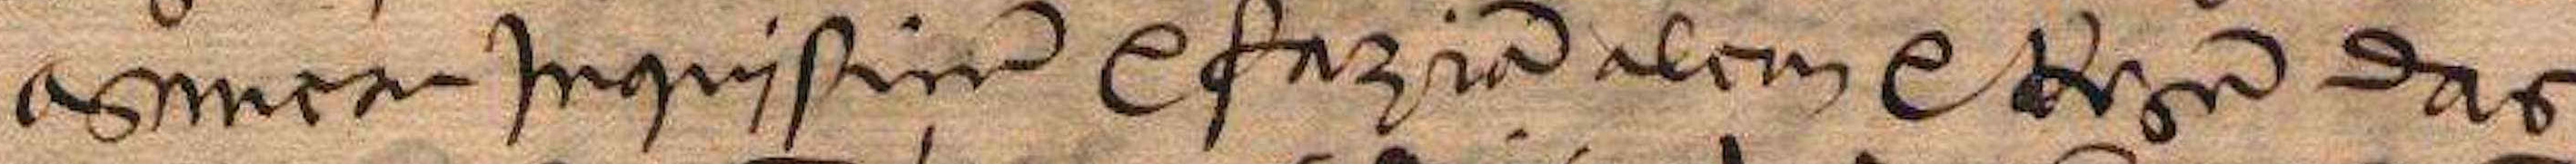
a sancta Jnqujsiçā e faziā a bem e Rezā das
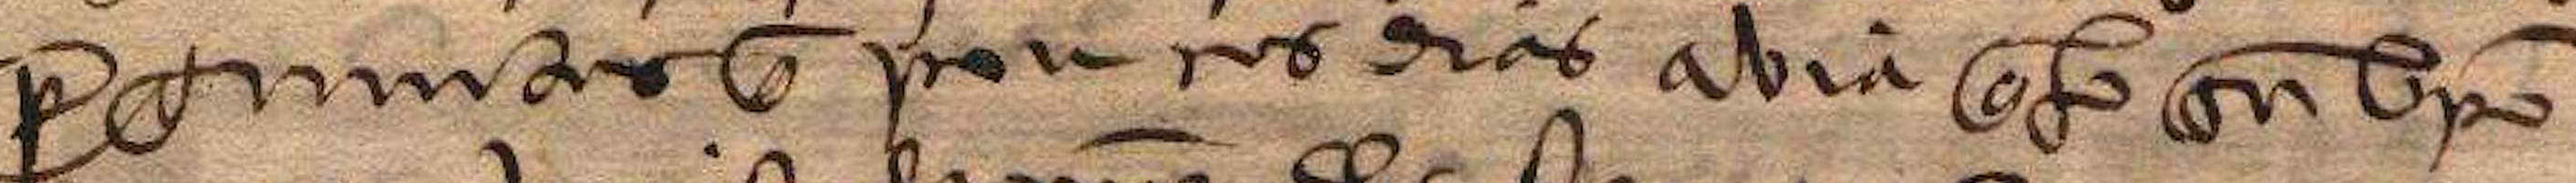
p̄gumtas q̄ poucos dias avia q̄ ho s̄or bpō
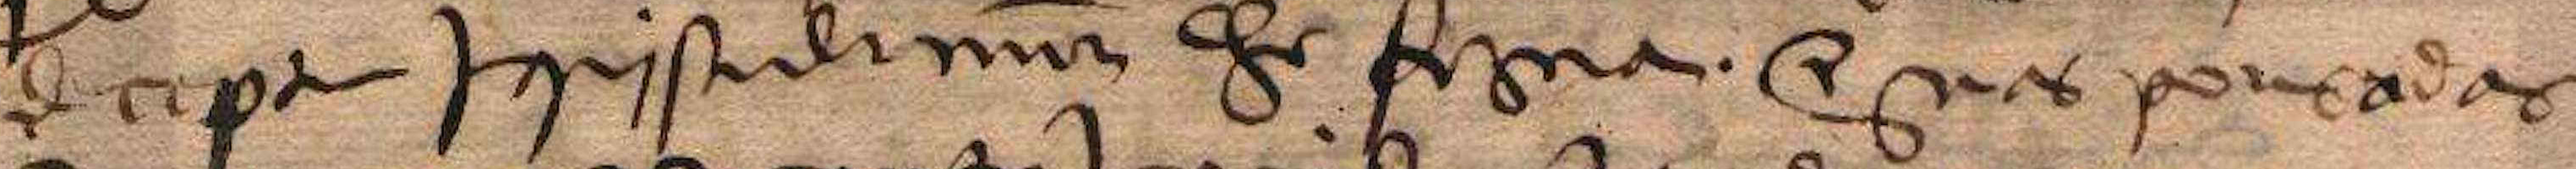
de cepta Jnqujsidor mōr lhe fezera. ē suas pousadas
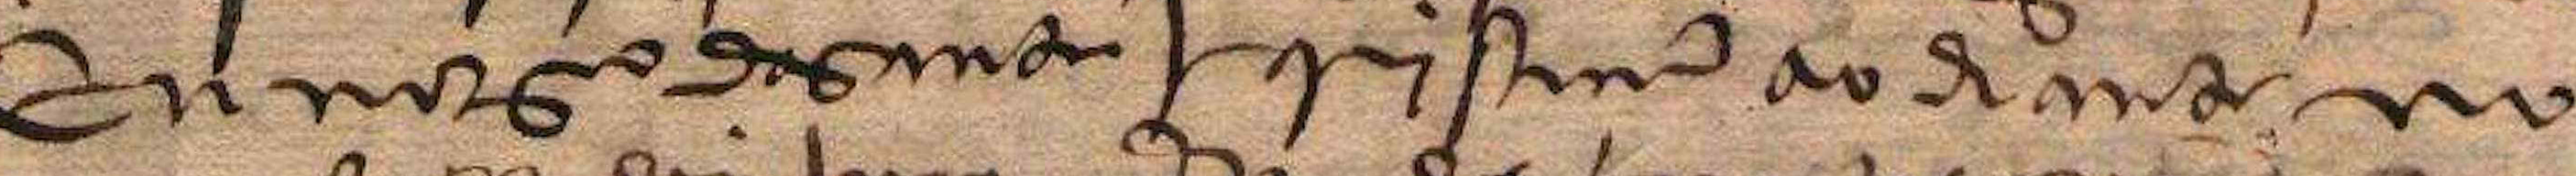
Eu notro da santa Jnqujsiçā ao diante no
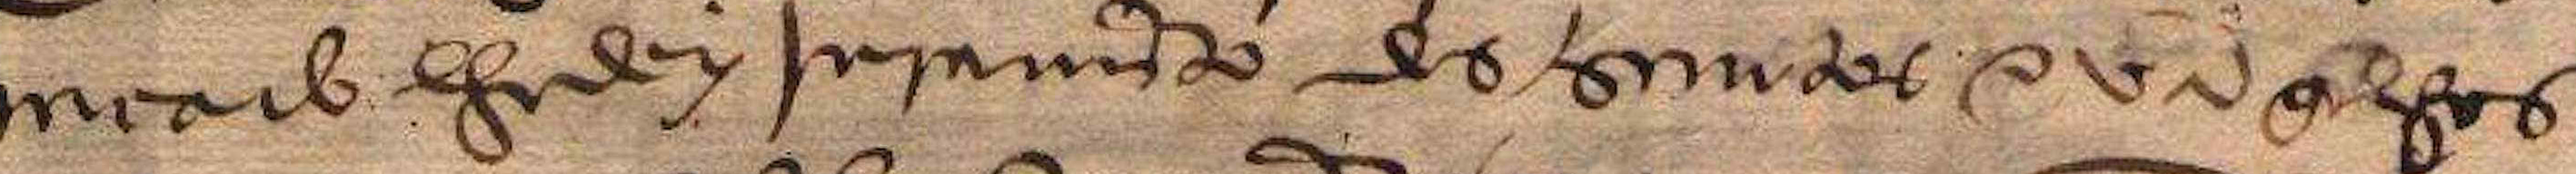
meado lhe dey Juramēto dos santos evāgelhos
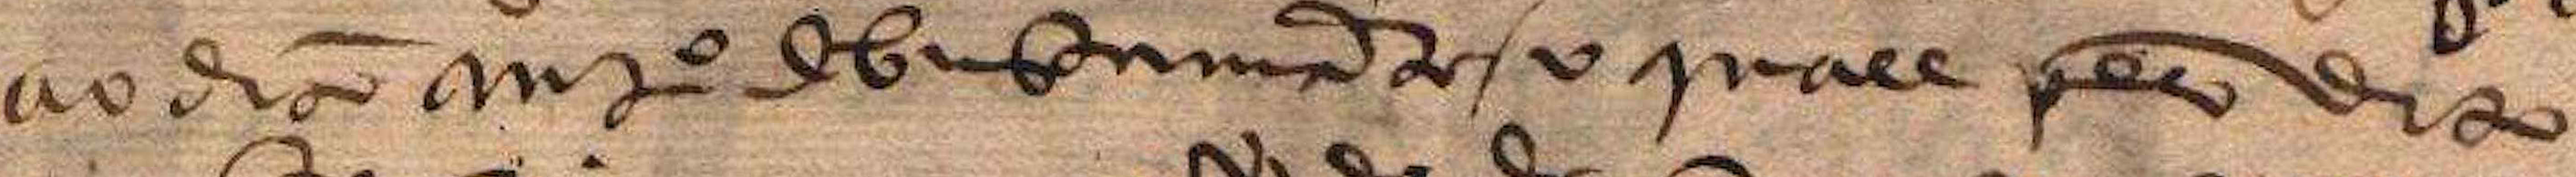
ao dito anto de bustamāte / o quall pl̄lo dito
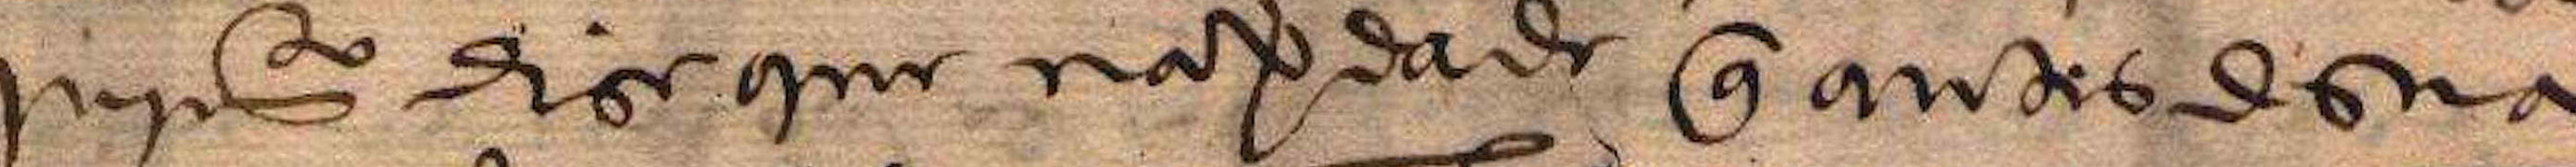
Juramto dise que era ꝟdade q̄ antes de sua
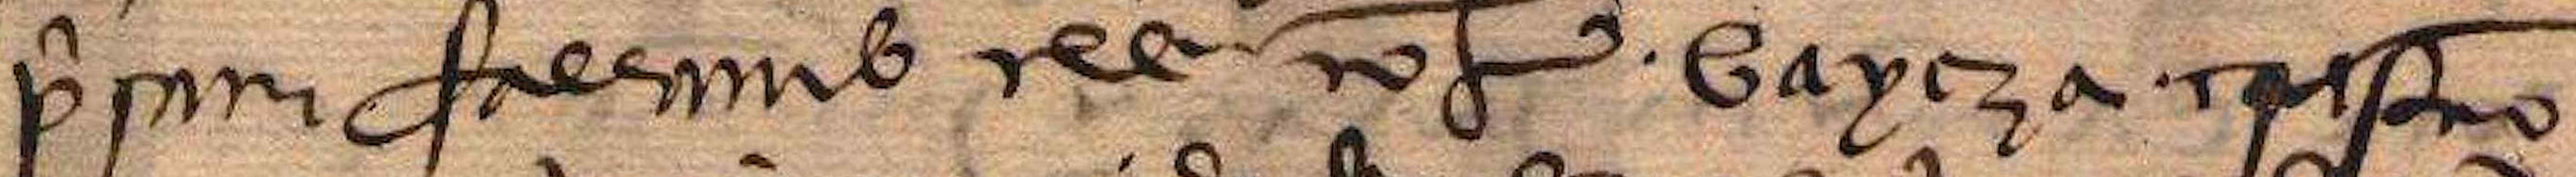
pisam fallando elle c̄o hū. bayeza. cristão
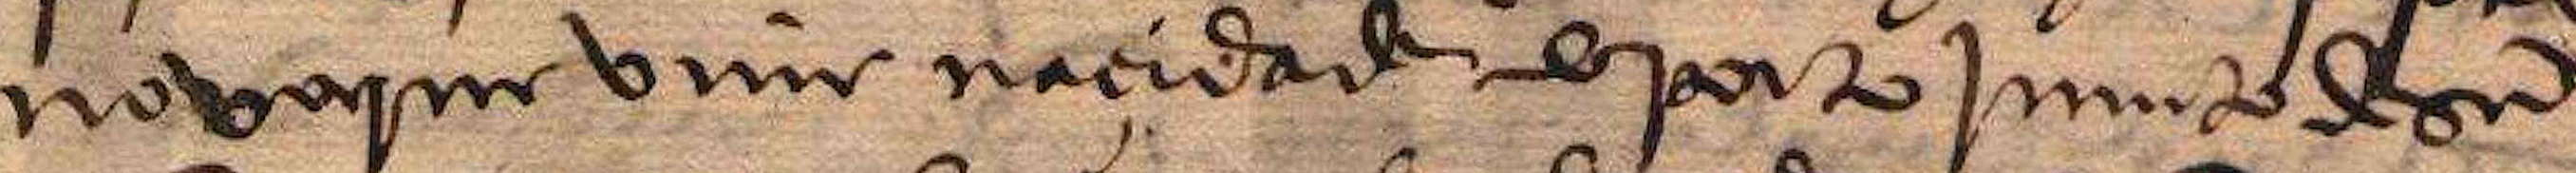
novo que viue na çidade do porto Jumto de sā
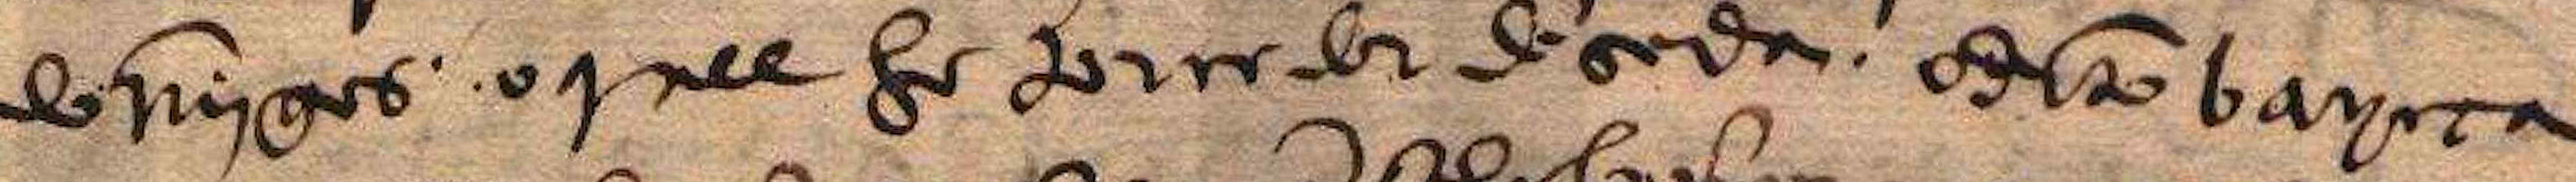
dom̄jgos ./. o quall he torcedor de seda. o dito bayeça
